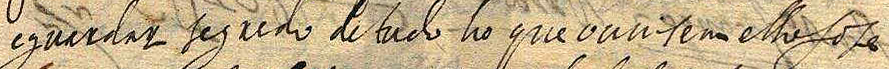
e guardar segredo de tudo ho que ouuisem e lhe fose
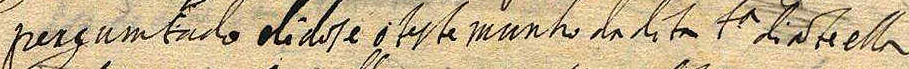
pergumtado e lēdose o testemunho da dita ta diāte ella
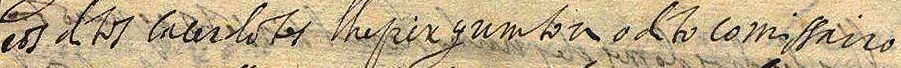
e os ditos cacerdotes lhe pergumtou o dito comissairo
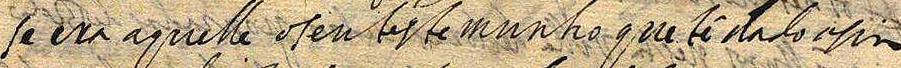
se era aquelle o seu testemunho que tē dado asim
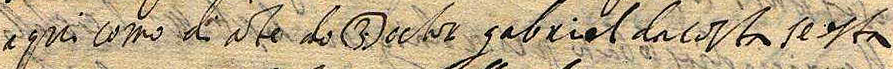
aqui como diāte do Doctor gabriel da costa se esta
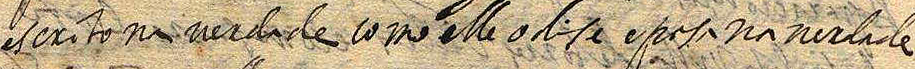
escrito na uerdade como elle o dise e pasa na uerdade
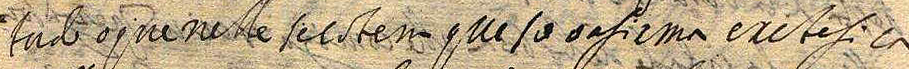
tudo o que nelle se cōtem que se o afirma e retefica
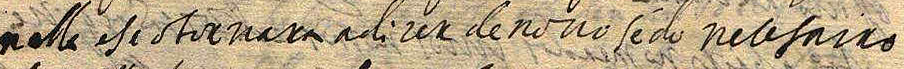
nelle e se o tornara a dizer de nouo sēdo necesairo
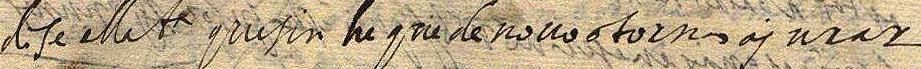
dise ella ta que sin he que de nouo o torna a jurar
